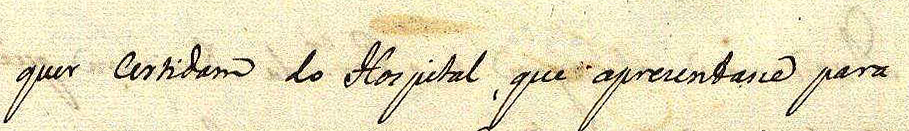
quer certidam do Hospital, que aprezentasse para
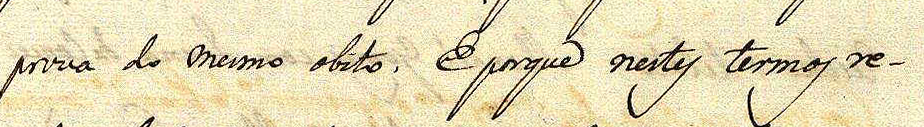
prova do mesmo obito. E porque nestes termos re
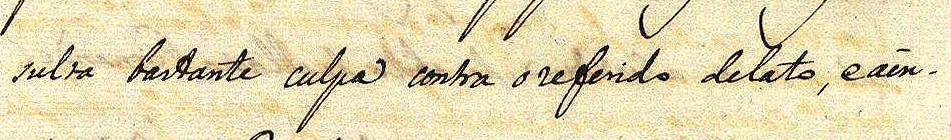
sulta bastante culpa contra o referido delato, e ain
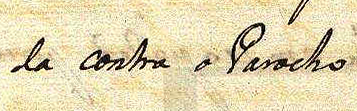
da contra o Parocho
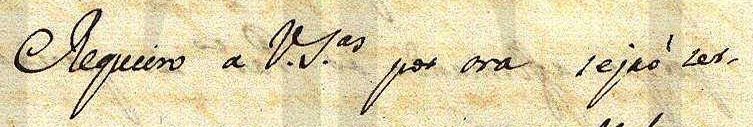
Requeiro a V. S.as por ora sejaõ ser
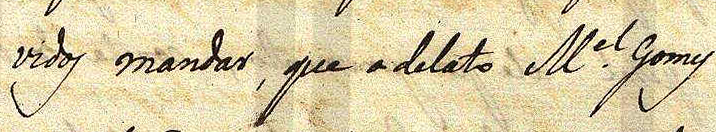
vidos mandar, que a delato M.el Gomes
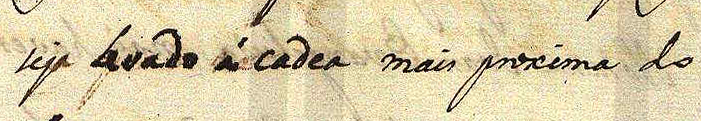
seja levado á cadea mais proxima do
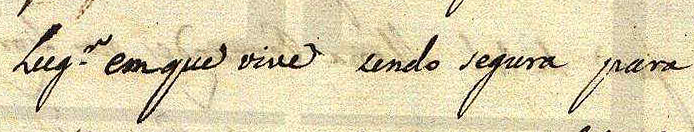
Lug.r em que vive sendo segura para
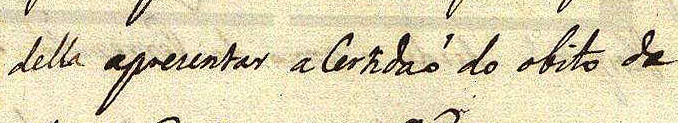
della aprezentar a Certidaõ do obito da
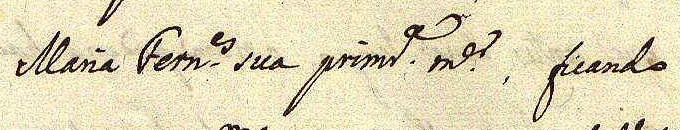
Maria Fern.es sua primr.a m.er, ficando
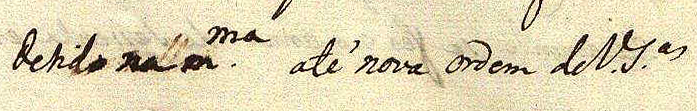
detido na m.ma até nova ordem de V. S.as
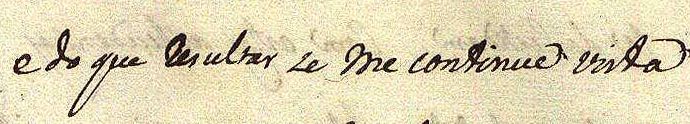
e do que Resultar se me continue vista
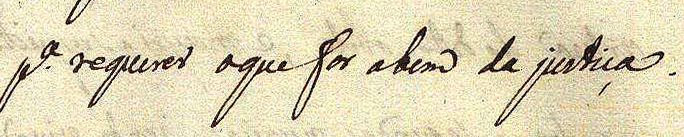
p.a requerer o que for a bem da justiça.
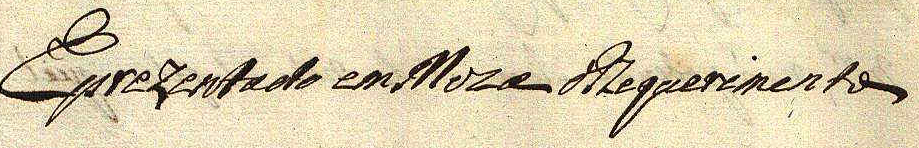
E prezentado em Meza o Requerimento
